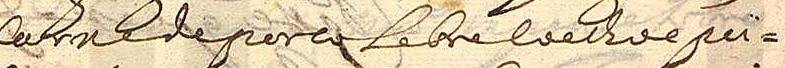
carne de porco Lebre coelho pei
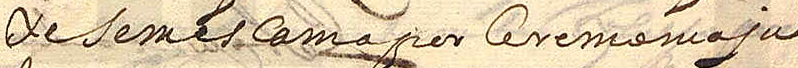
xe sem escama por Ceremonia ju
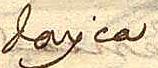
dayca
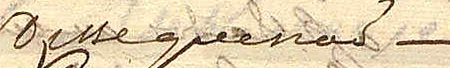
Disse que naõ
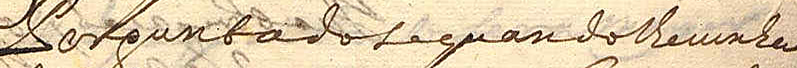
Perguntado se quando lhe uinha
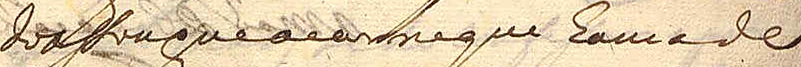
do assougue a carne que hauia de
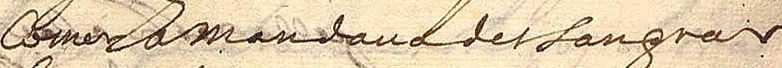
comer a mandaua dessangrar
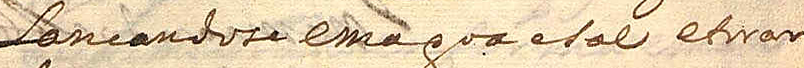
Lancandose em agoa e sal e tirar
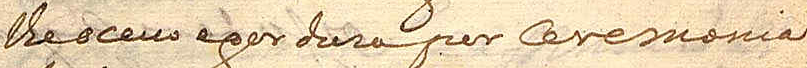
lhe o ceuo e gordura per ceremonia
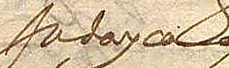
Judayca
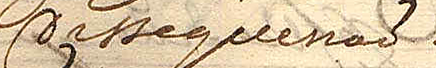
Disse que naõ
